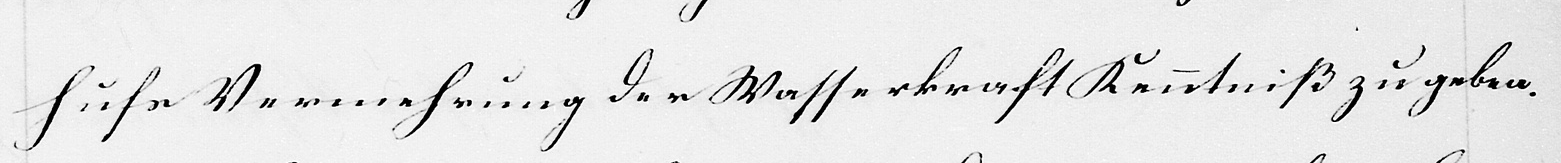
hufs Vermehrung der Wasserkraft Kenntniß zu geben.
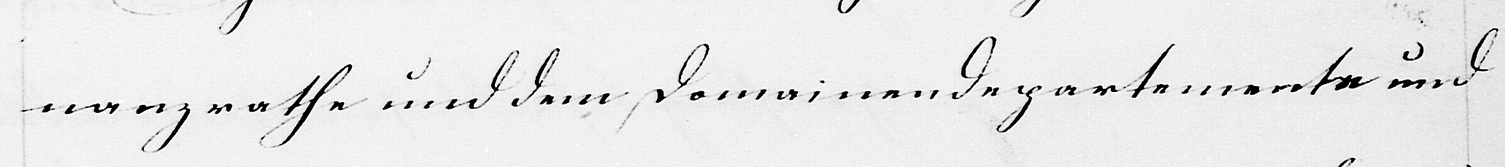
nanzrathe und dem Domainendepartemente und
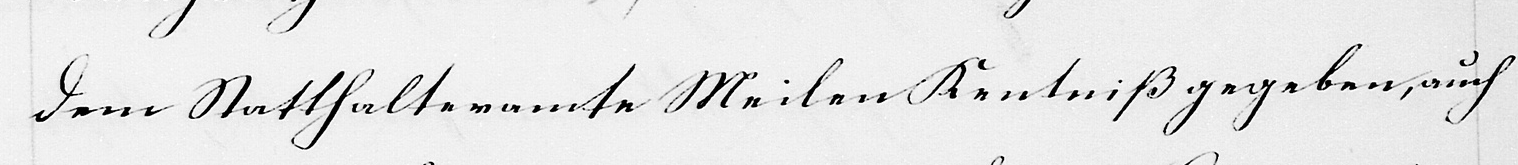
dem Statthalteramte Meilen Kentniß gegeben, auch
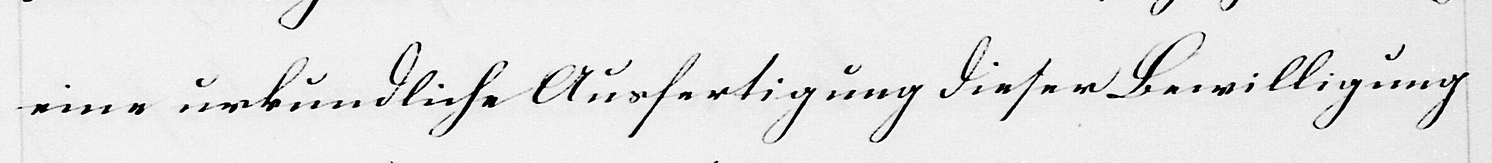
eine urkundliche Ausfertigung dieser Bewilligung
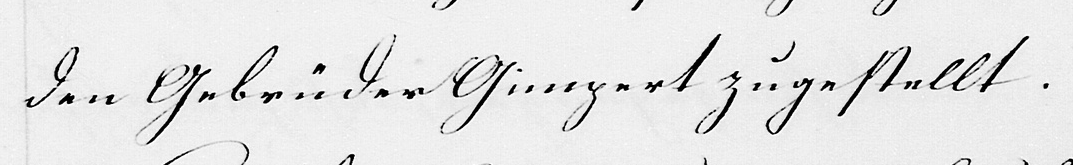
den Gebrüder Gimpert zugestellt.
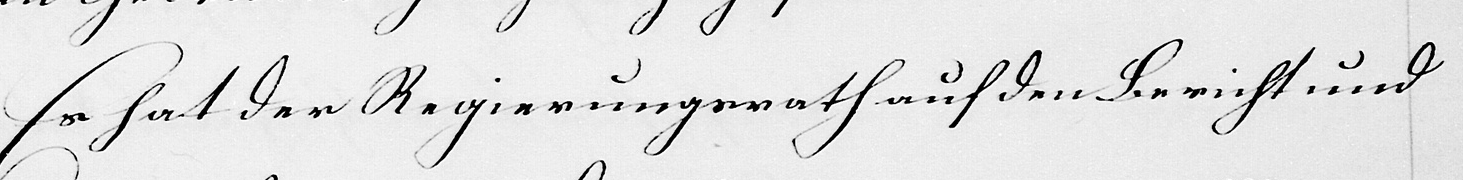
Es hat der Regierungsrath auf den Bericht und
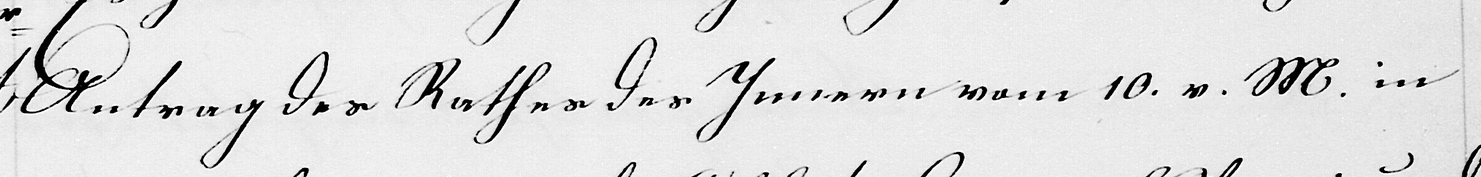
Antrag des Rathes des Innern vom 10. v. M. in
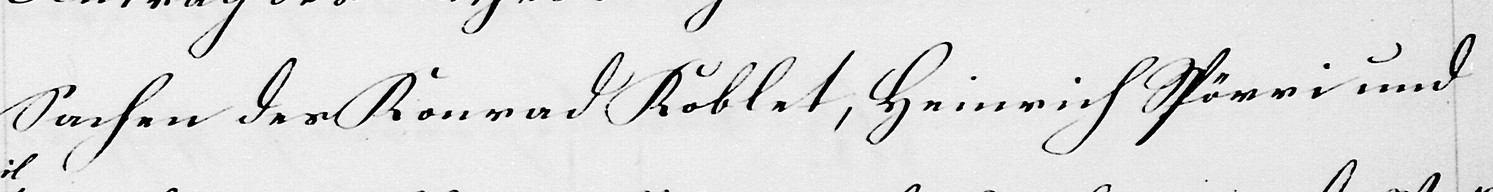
Sachen des Konrad Koblet, Heinrich Spörri und
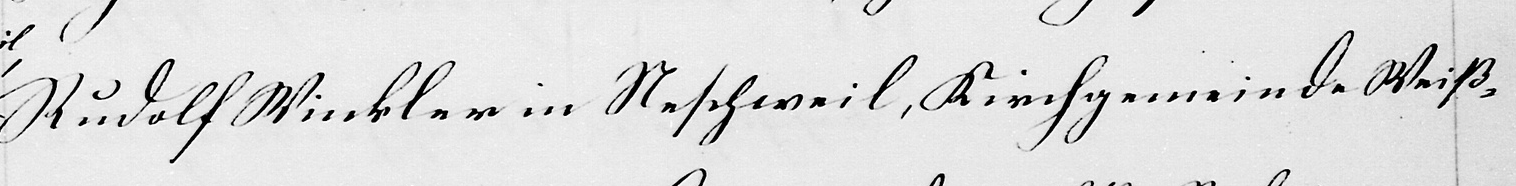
Rudolf Winkler in Neschweil, Kirchgemeinde Weiß¬
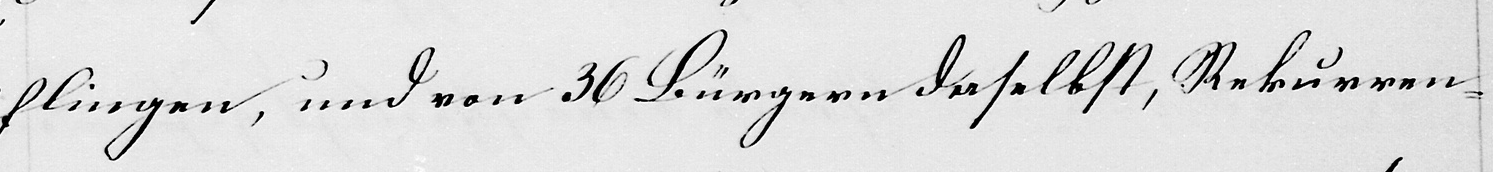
lingen, und von 36 Bürgern daselbst, Rekurren-
